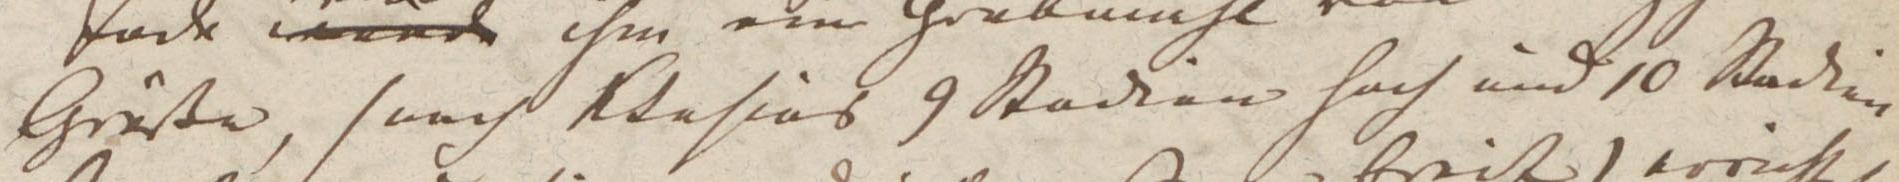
Grösse, (nach Ktesias 9 Stadien hoch und 10 Stadien
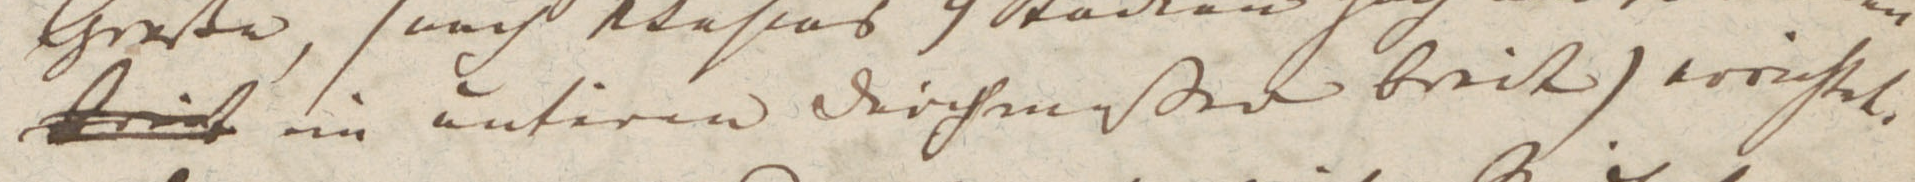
breit im unteren Durchmesser breit) errichtet.
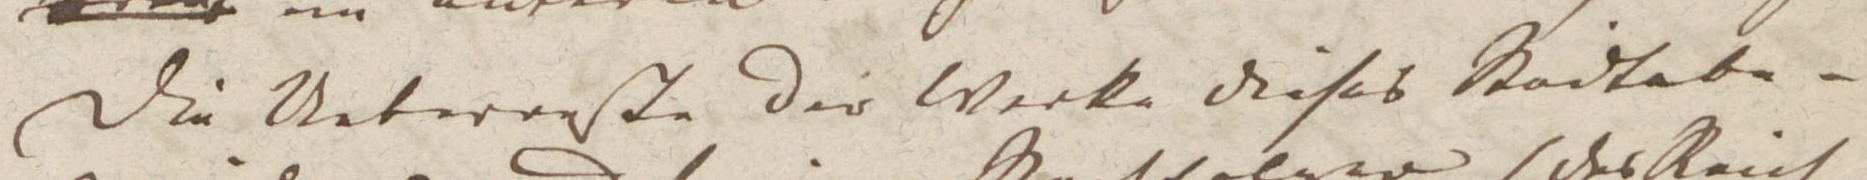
Die Ueberreste der Werke dieses Stadtbe-
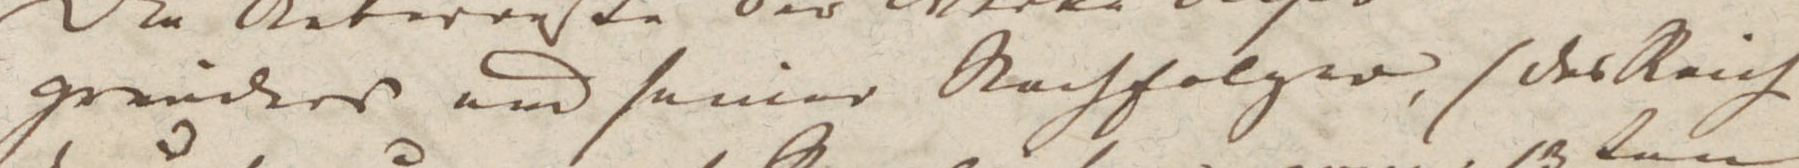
gründers und seiner Nachfolger, (das Reich
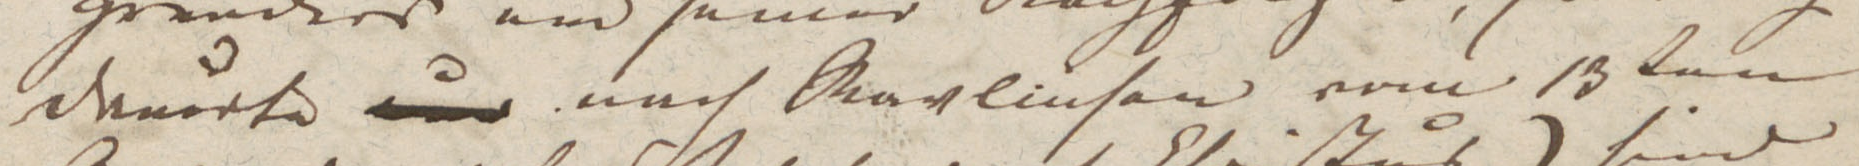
dauerte nur nach Rawlinson vom 13ten
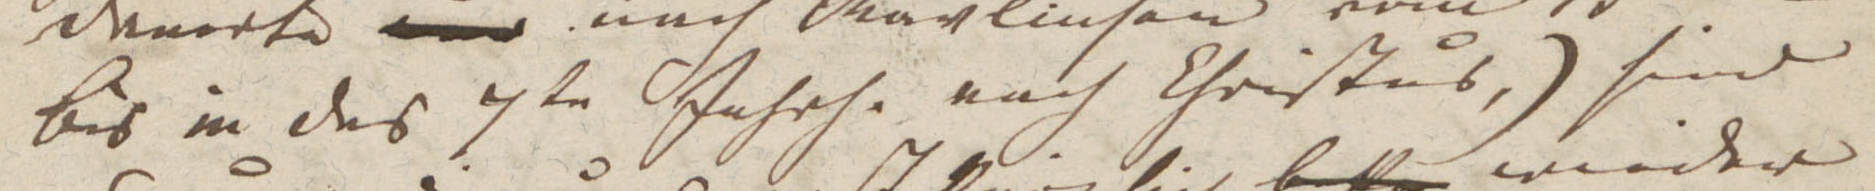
bis in das 7te Jahrh. nach Christus,) sind
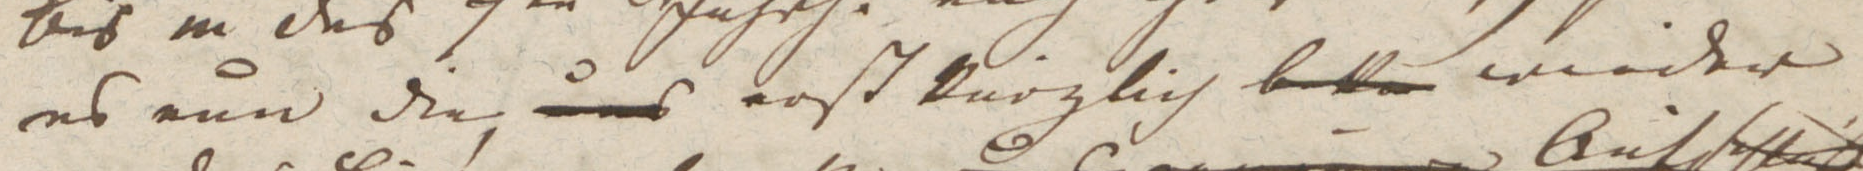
es nun die, uns erst kürzlich bek wieder
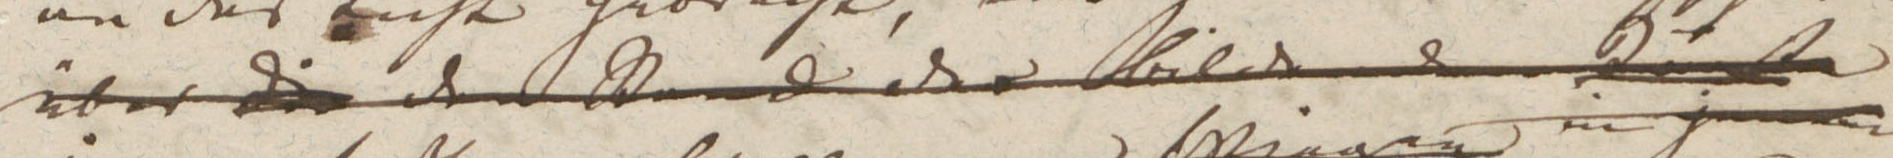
über die den Stand der bildenden Künste
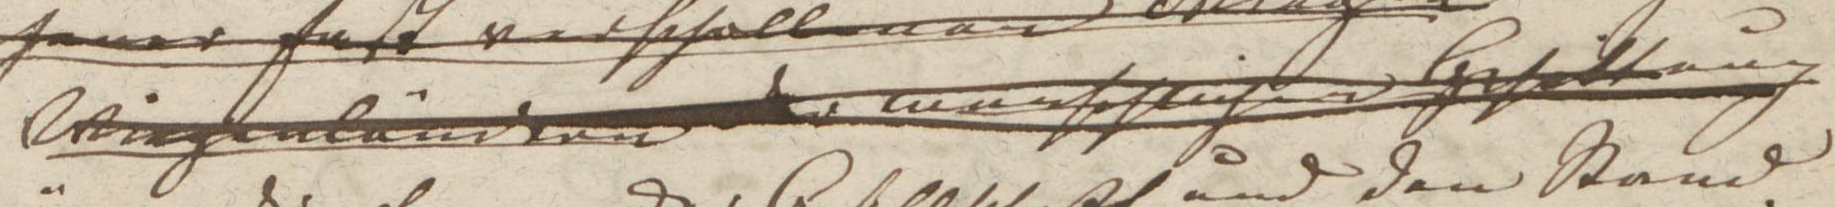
Wiegenländern der menschlichen Gesittung
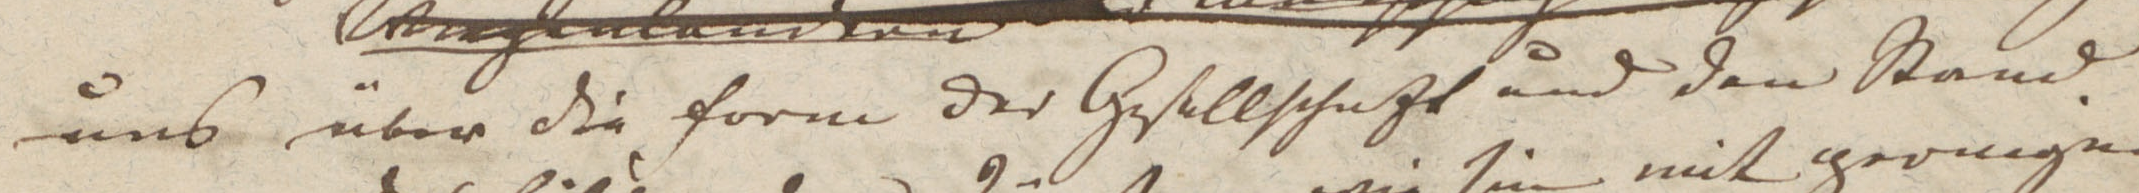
uns über die Form der Gesellschaft und den Stand
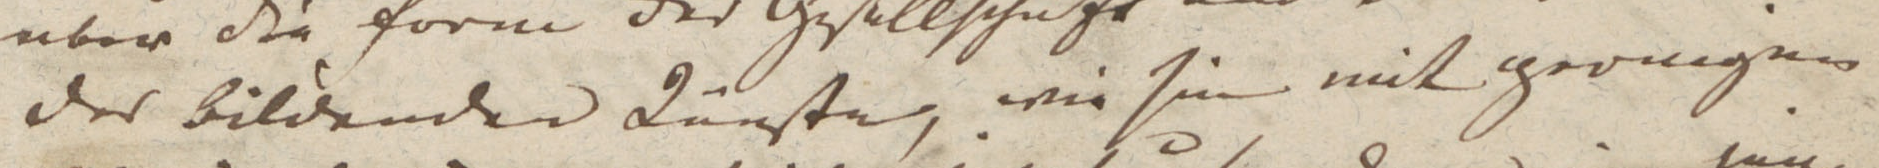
der bildenden Künste, wie sie mit geringen
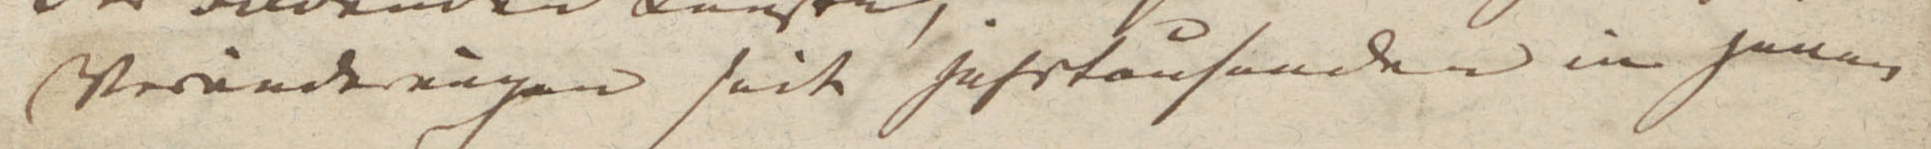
Veränderungen seit jahrtausenden in jenen
